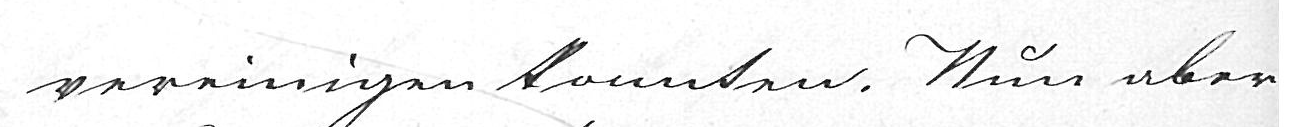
vereinigen konnten. Nun aber
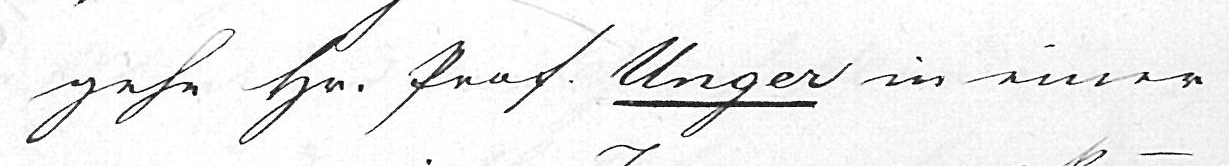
sehgehe Hr. Prof. Unger in einer
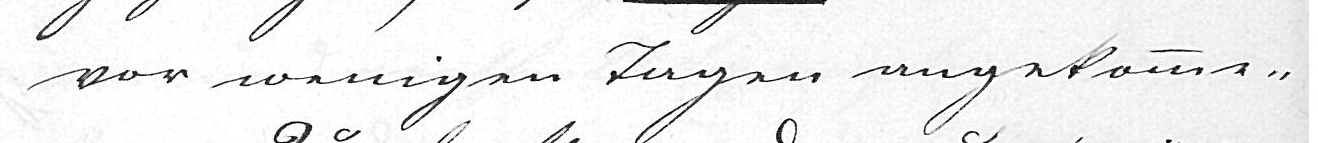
vor wenigen Tagen angekomme-
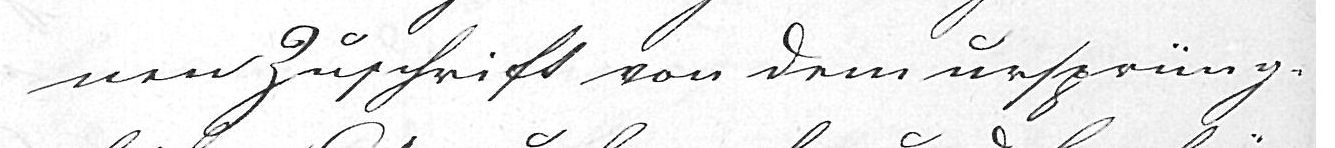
nen Zuschrift von dem ursprüng-
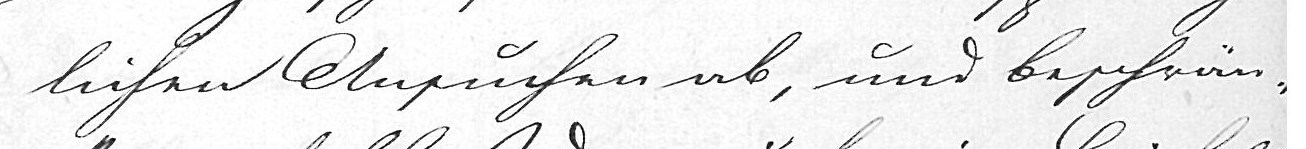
lichen Ansuchen ab, und beschrän-
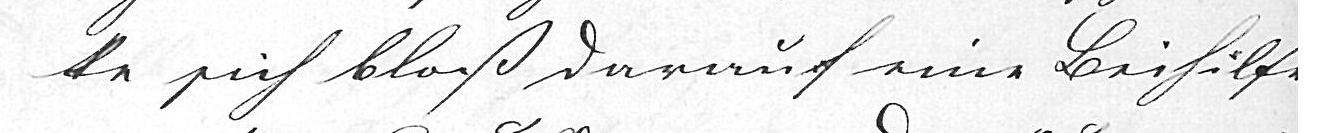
ke sich bloß darauf eine Beihilfe
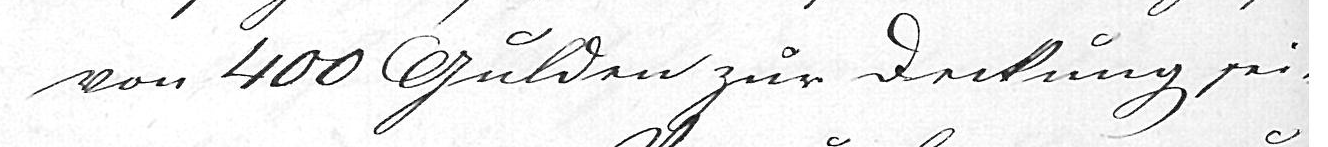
von 400 Gulden zur Deckung sei-
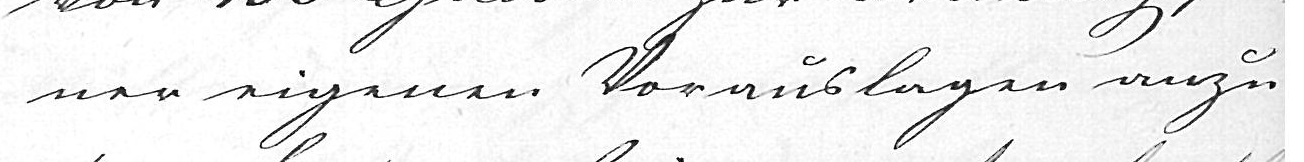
ner eigenen Vorauslagen anzu-
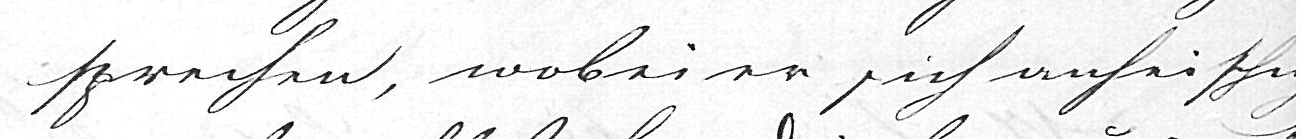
sprechen, wobei er sich anheischig
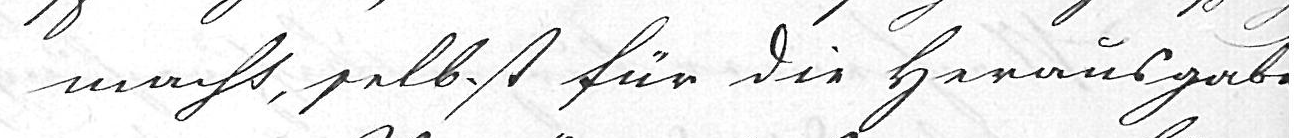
macht, selbst für die Herausgabe
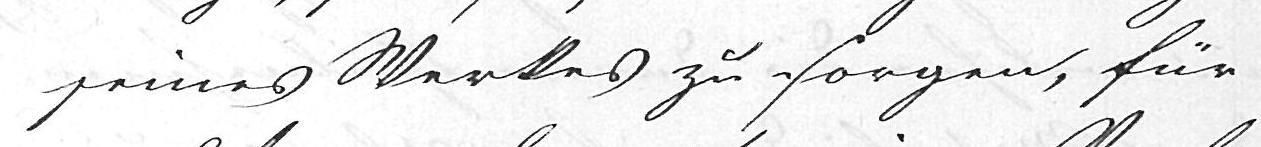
seines Werkes zu sorgen, für
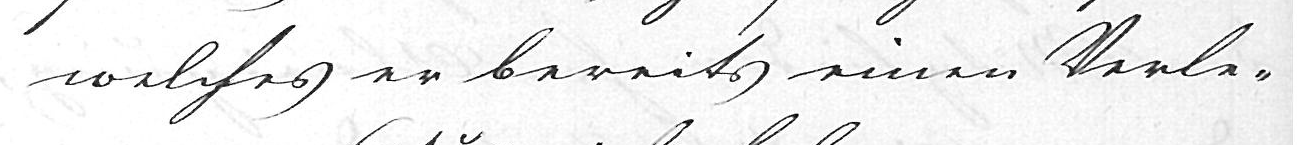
welches er bereits einen Verle-
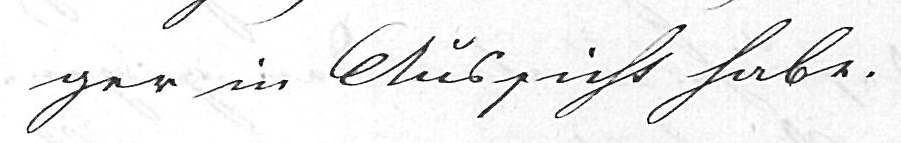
ger in Aussicht habe.
